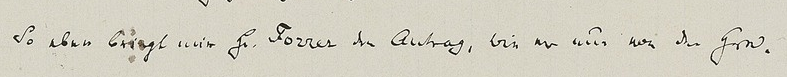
So eben bringt mir Hr. Forrer den Antrag, wie er uns von den Hrn.
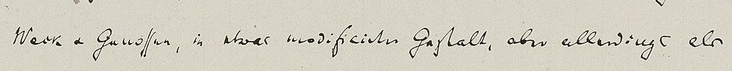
Weck & Genossen, in etwas modificirter Gestalt, aber allerdings als
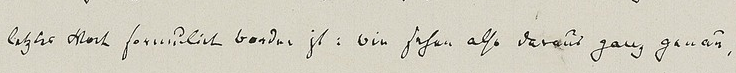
letztes Wort formulirt worden ist: wir sehen also daraus ganz genau,
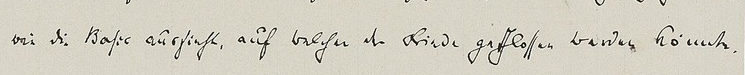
wie die Basis aussieht, auf welcher der Friede geschlossen werden könnte.
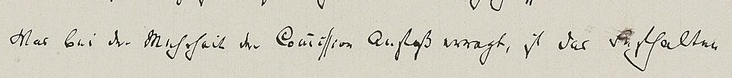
Was bei der Mehrheit der Commission Anstoß erregt, ist das Festhalten
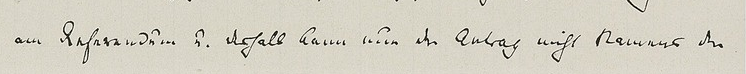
am Referendum u. deshalb kann nun der Antrag nicht Namens der
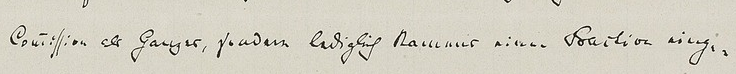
Commission als Ganzer, sondern lediglich Namens einer Fraction einge-
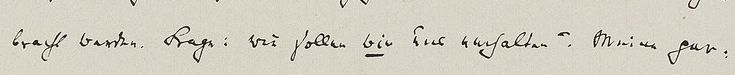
bracht werden. Frage: wie sollen wir uns verhalten? Meine per-
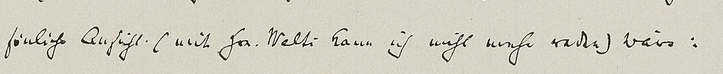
sönliche Ansicht (mit Hrn. Welti kann ich nicht mehr reden) wäre:
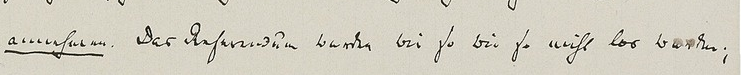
annehmen. Das Referendum werden wir so wie so nicht los werden;
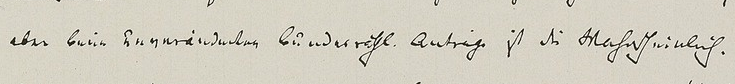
aber beim unveränderten bundesräthl. Antrage ist die Wahrscheinlich-
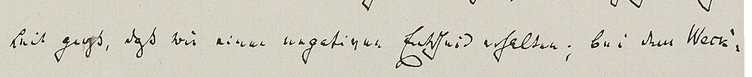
keit groß, daß wir einen negativen Entscheid erhalten; bei dem Weck-
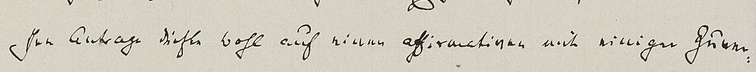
schen Antrage dürfte wohl auf einen affirmativen mit einiger Zuver-
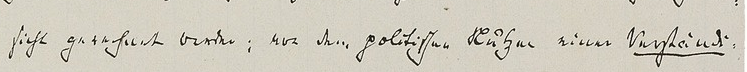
sicht gerechnet werden; von dem politischen Nutzen einer Verständi-
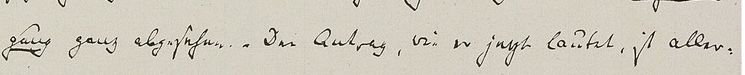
gung ganz abgesehen. – Der Antrag, wie er jezt lautet, ist aller-
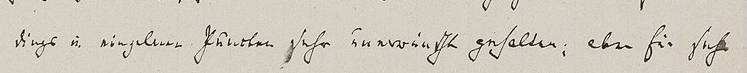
dings in einzelnen Puncten sehr unerwünscht gehalten; aber für sehr
